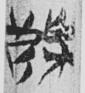殜
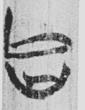句（苟）
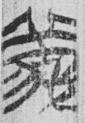義
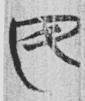母
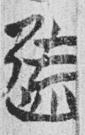○（久）
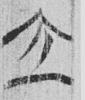立
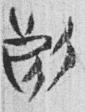死
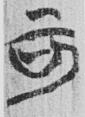何
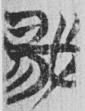○（傷）
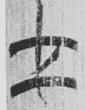才（哉）
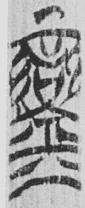鑾（欒）
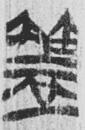箸（書）
